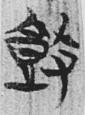鼓
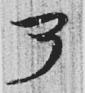乃
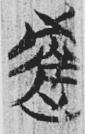○（失）
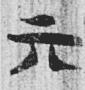亓
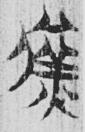備（服）
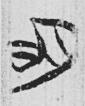明
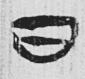日
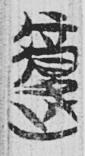○（復）
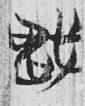○（陳）
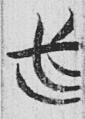必
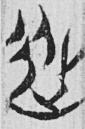○（過）
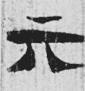亓
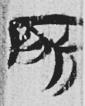所
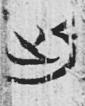此
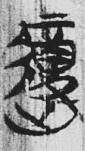復
